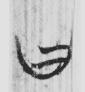曰
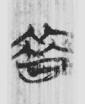昔
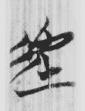𫊟
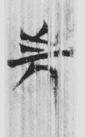先
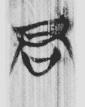君
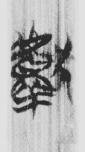獻
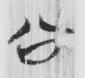公
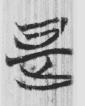是
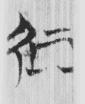凥
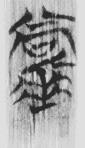掌
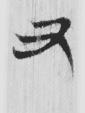又
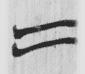二
